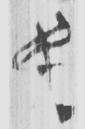民
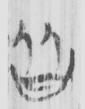皆
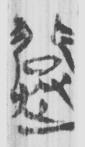{興止}
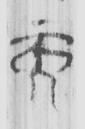而
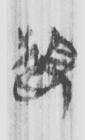{見兆}
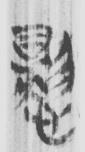{則心}
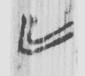亡
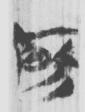所
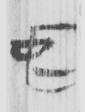𠁩
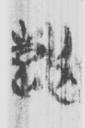朝
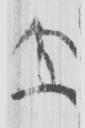立
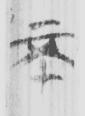不
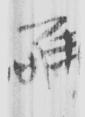唯
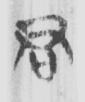君
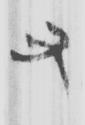又
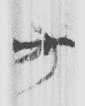方
